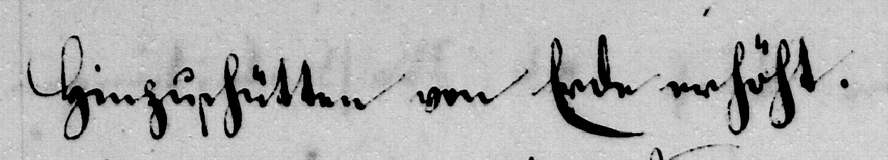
hinzuschütten von Erde erhöht.
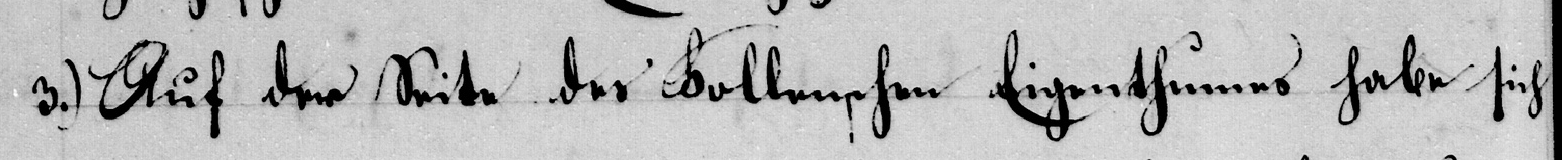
3.) Auf der Seite des Follenschen Eigenthumes habe sich
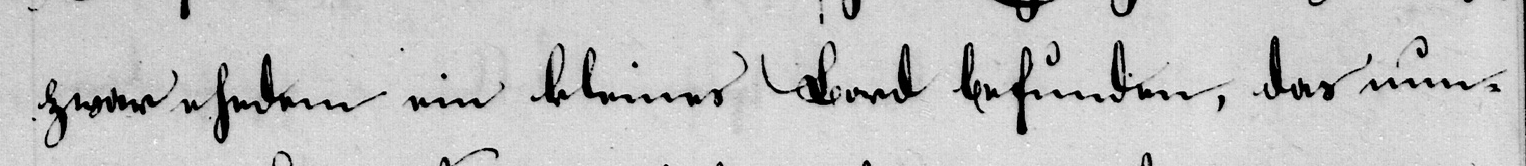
zwar ehedem ein kleines Bord befunden, das nun¬
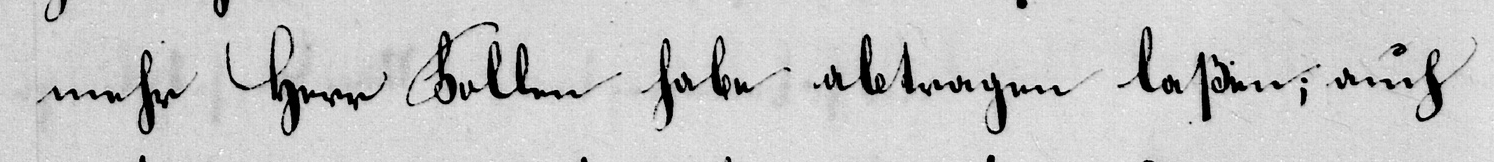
mehr Herr Follen habe abtragen laßen; auch
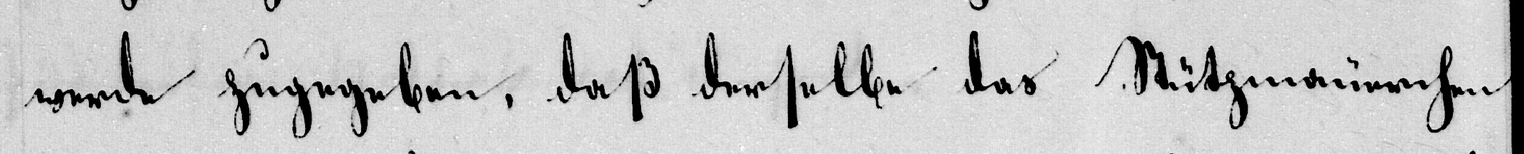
wurde zugegeben, daß derselbe das Stützmäuerchen
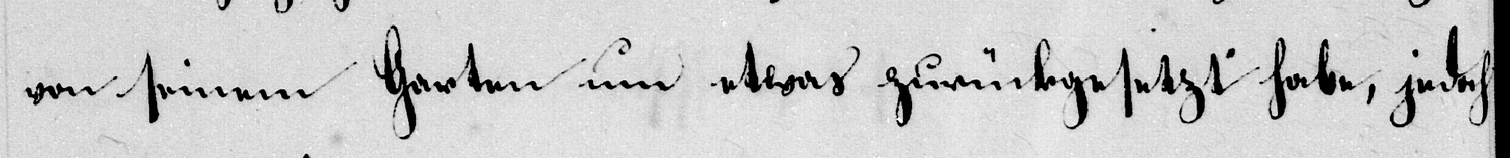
von seinem Garten um etwas zurückgesetzt habe, jedoch
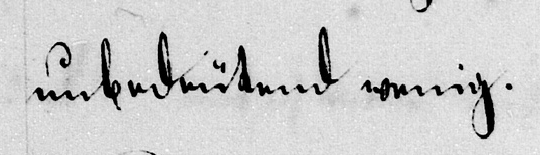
unbedeutend wenig.
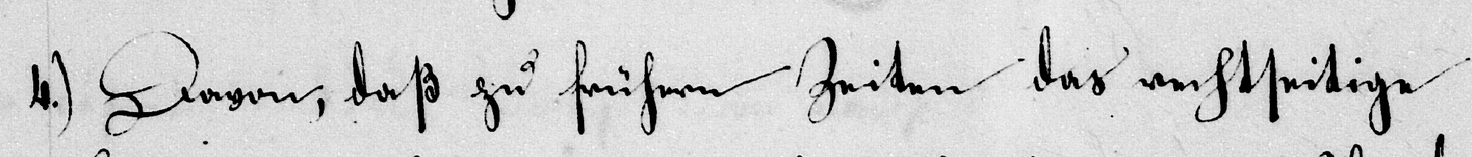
4.) Davon, daß zu frühern Zeiten das rechtseitige
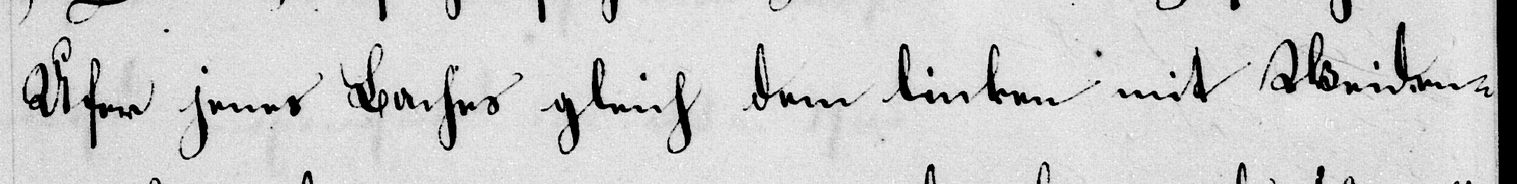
Ufer jenes Baches gleich dem linken mit Weiden¬
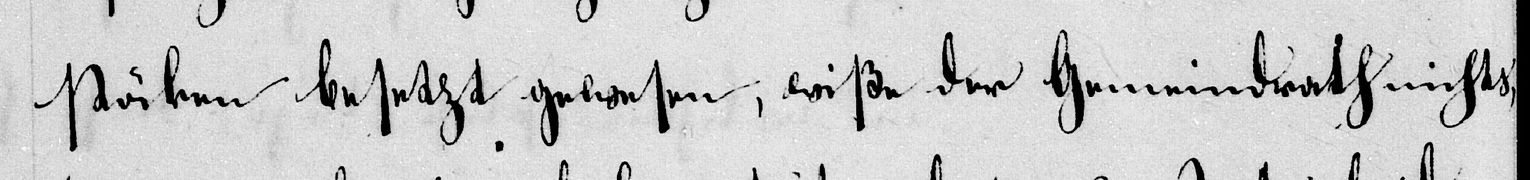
stöcken besetzt gewesen, wiße der Gemeindrath nichts,
